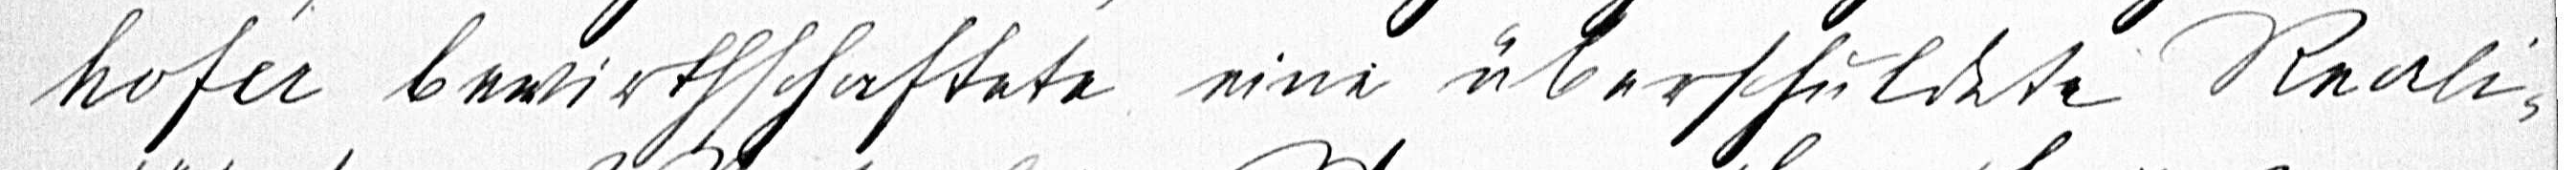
hofer bewirthschaftete eine überschuldete Reali¬
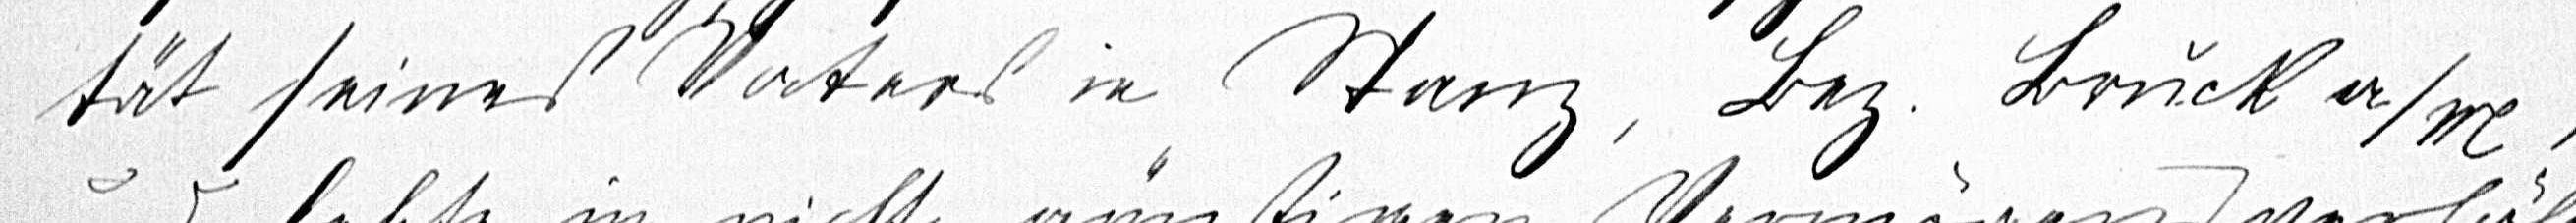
tät seines Vaters in Stanz, Bez. Bruck a/M,
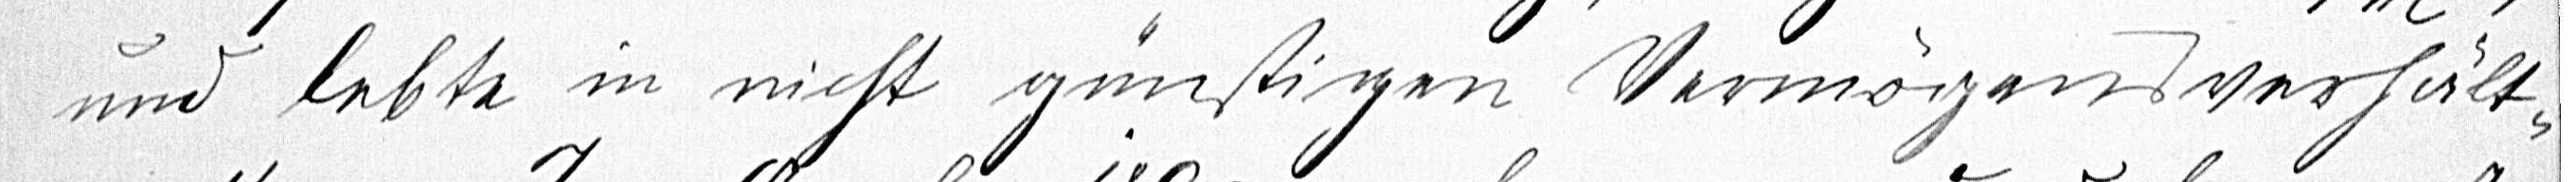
und lebte in nicht günstigen Vermögensverhält¬
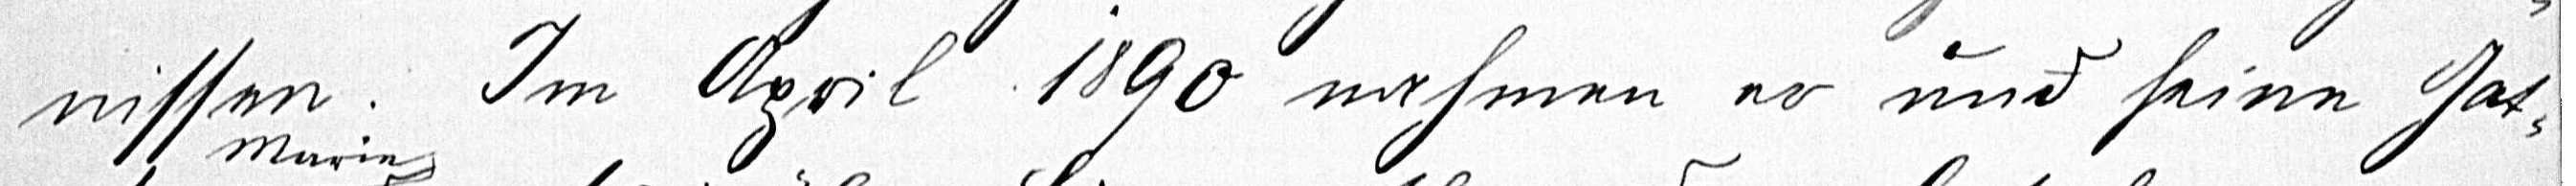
nissen. Im April 1890 nahmen er und seine Gat¬
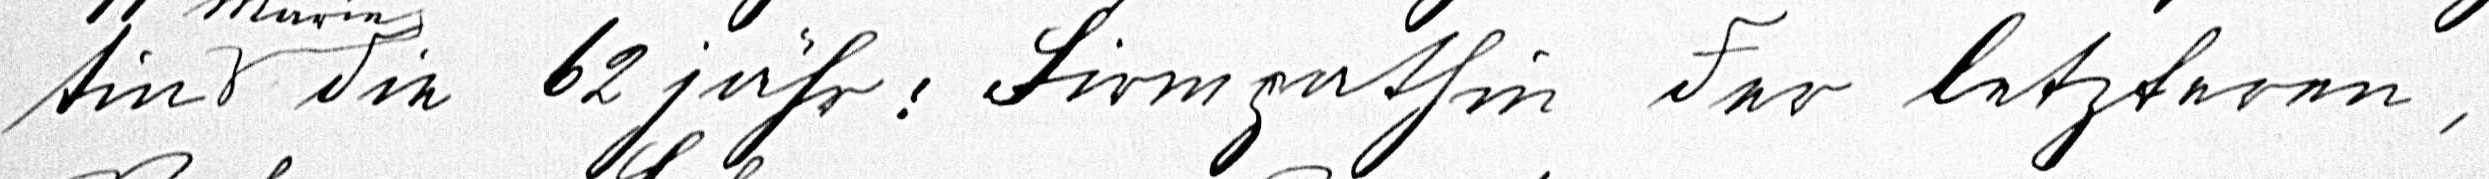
tin Marie die 62jähr Firmpathin der letzteren,
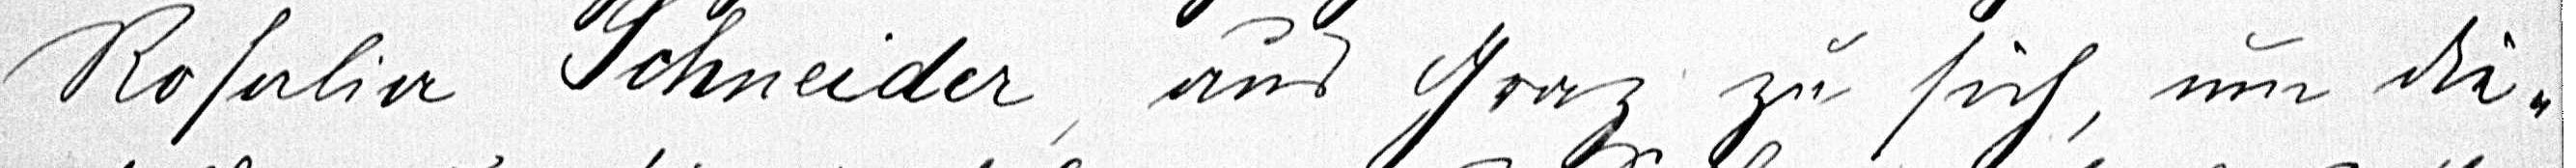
Rosalia Schnieder, aus Graz zu sich, um die¬
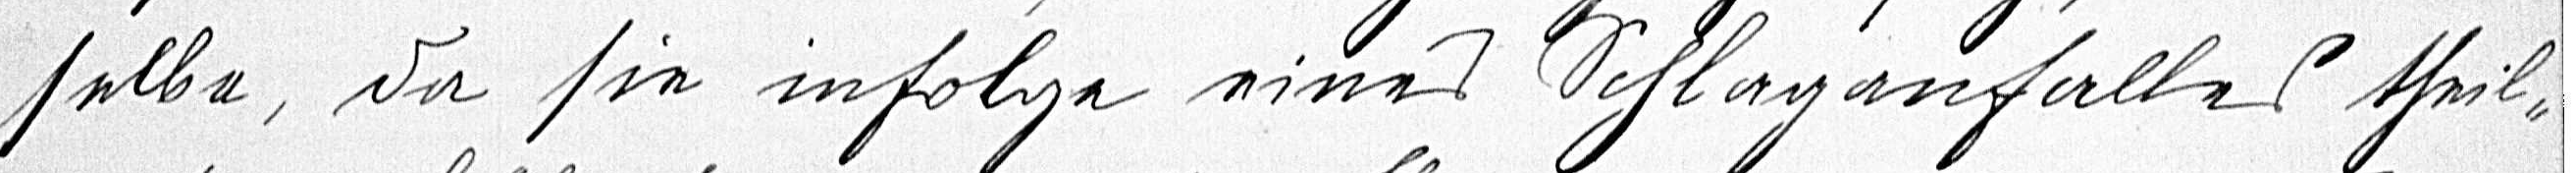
selbe da sie infolge eines Schlaganfalles theil¬
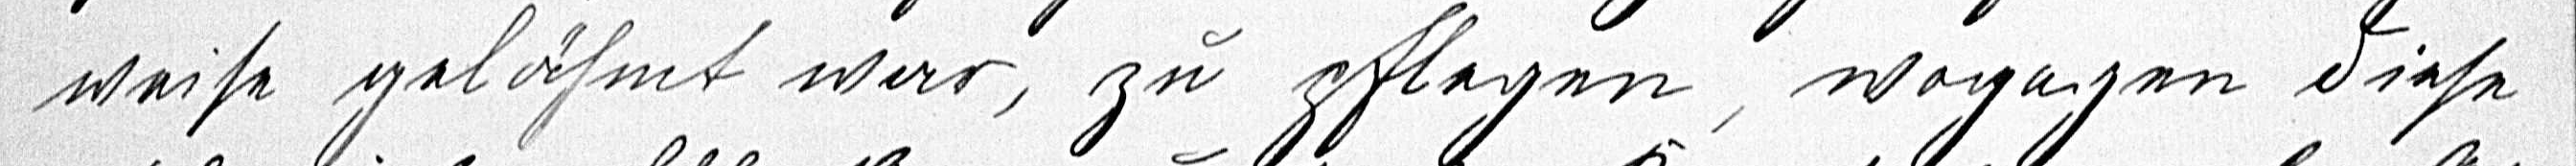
weise gelähmt war, zu pflegen, wogegen diese
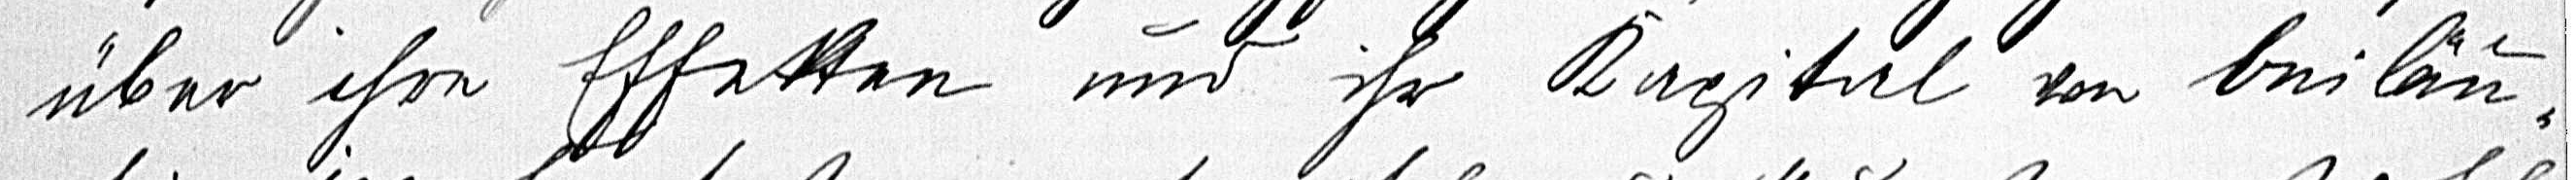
über ihre Effekten und ihr Kapital von beiläu¬
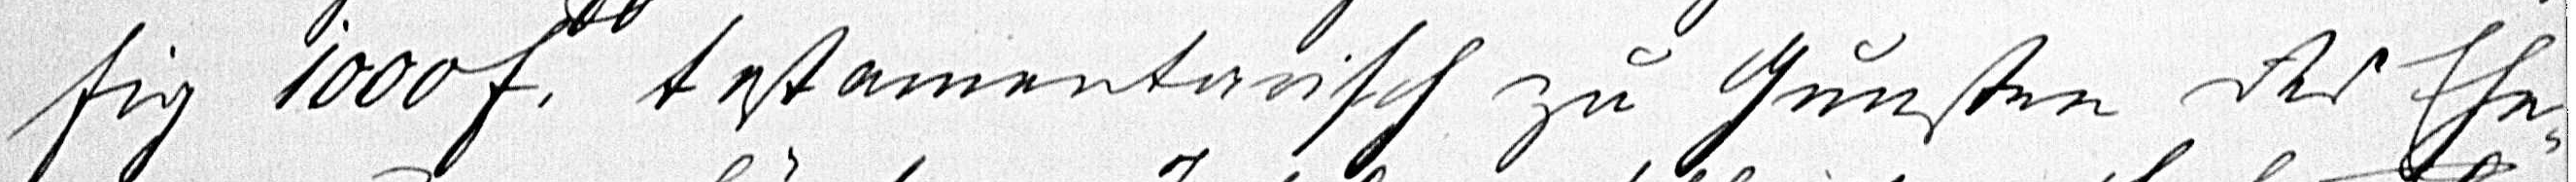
fig 1000f testamentarisch zu Gunsten des Ehe¬
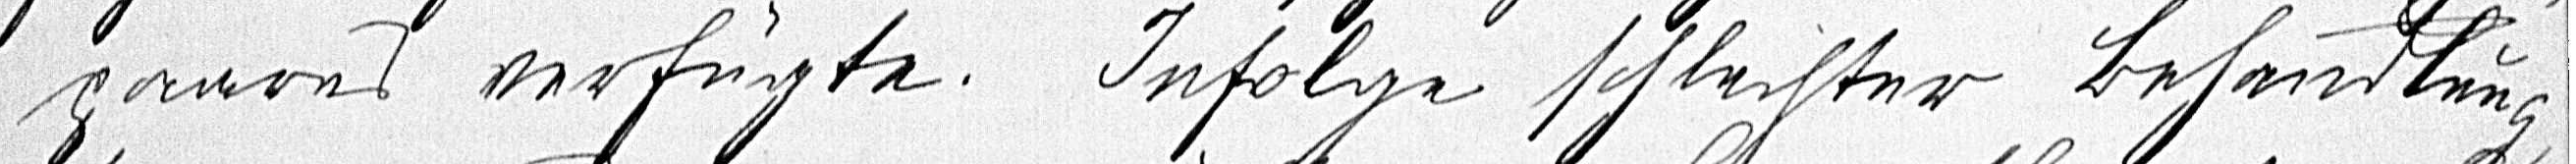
paares verfügte. Infolge schlechter Behandlung
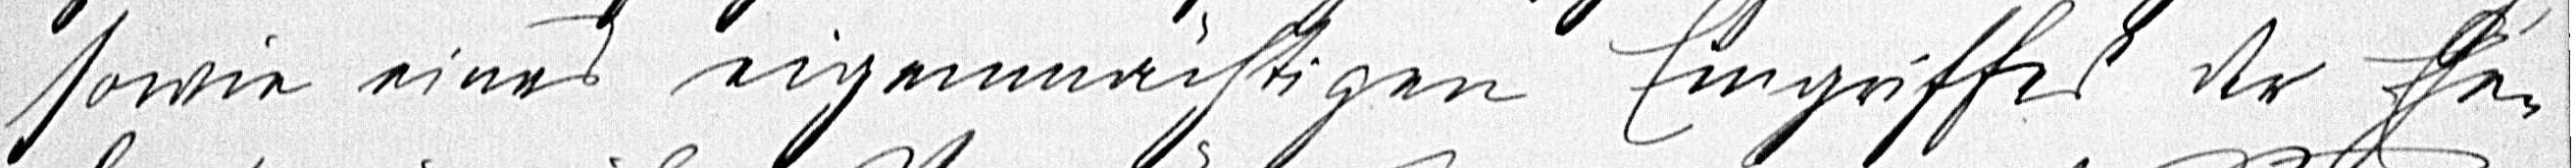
sowie eines eigenmächtigen Eingriffes der Ehe¬
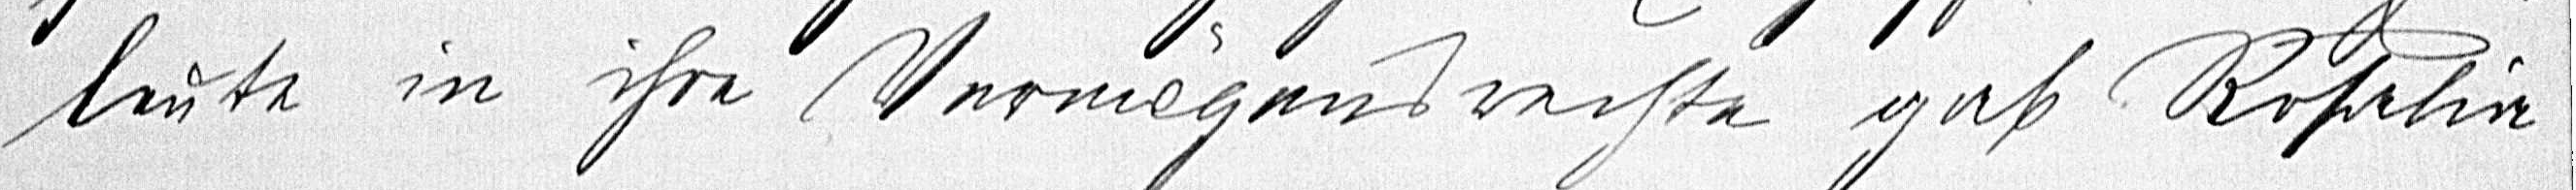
leute in ihre Vermögensrechte gab Rosalia
